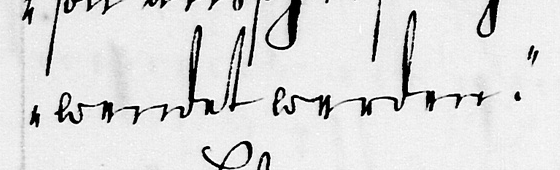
wendet werden.“
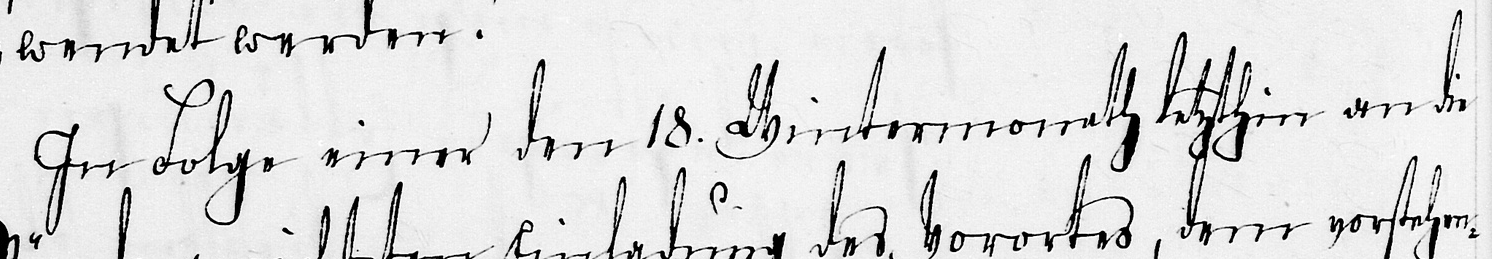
In Folge einer den 18. Wintermonath letzthin an die
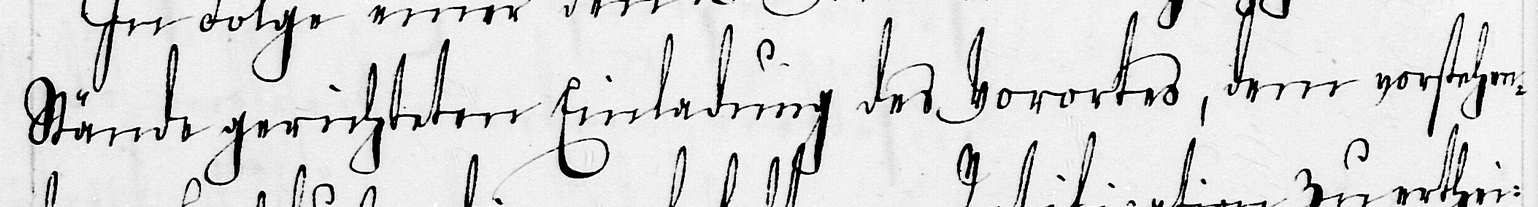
Stände gerichteten Einladung des Vorortes, dem vorstehe¬
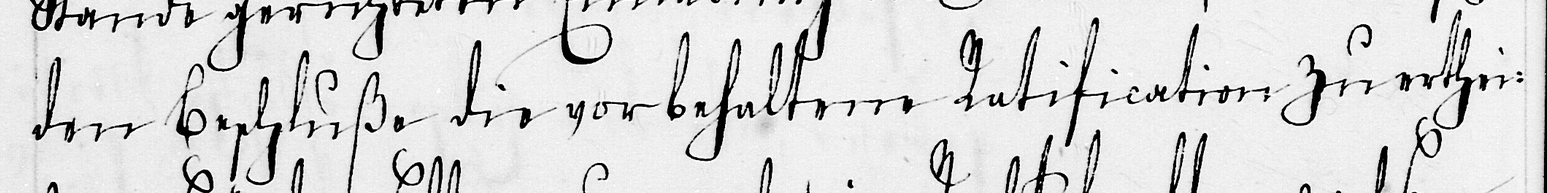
nden Beschluße die vorbehaltene Ratification zu erthei¬
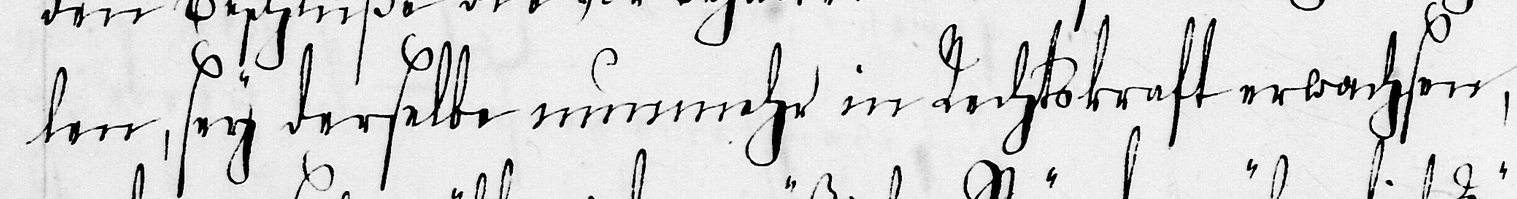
len, sey derselbe nunmehr in Rechtskraft erwachsen,
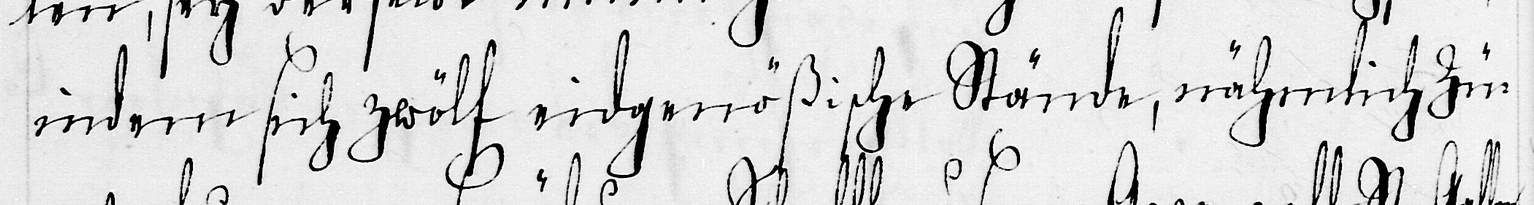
indem sich zwölf eidgenößische Stände, nähmlich Zü¬
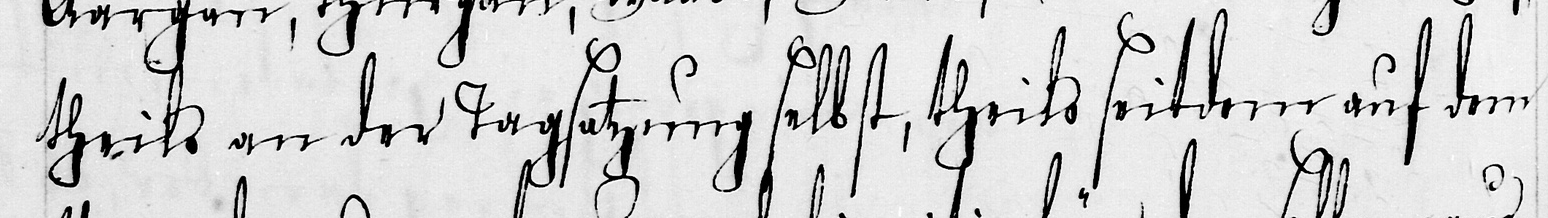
theils an der Tagsatzung selbst, theils seitdem auf dem
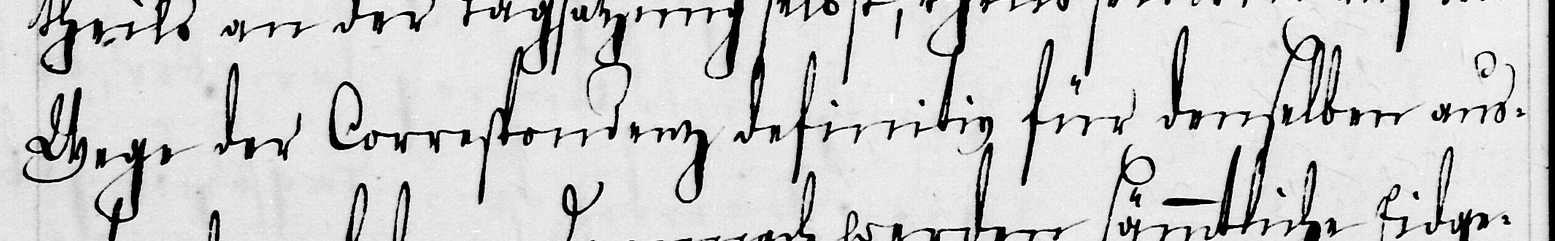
Wege der Correspondenz definitiv für denselben aus¬
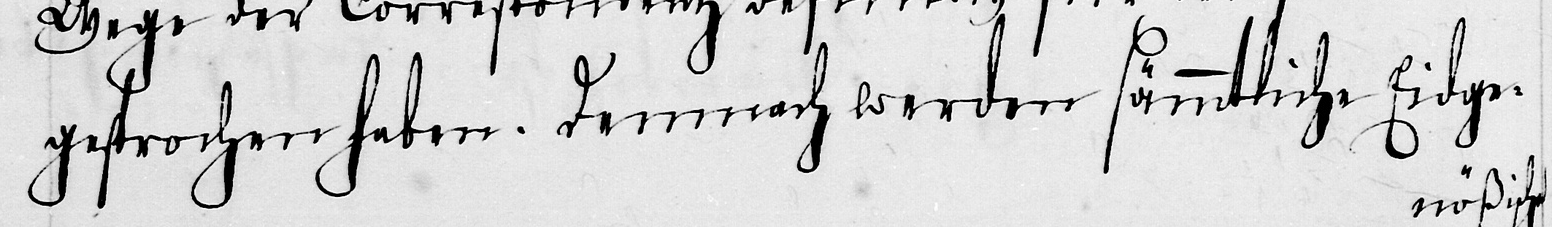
gesprochen haben. Demnach werden sämmtliche Eidge-
